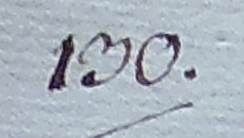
130.
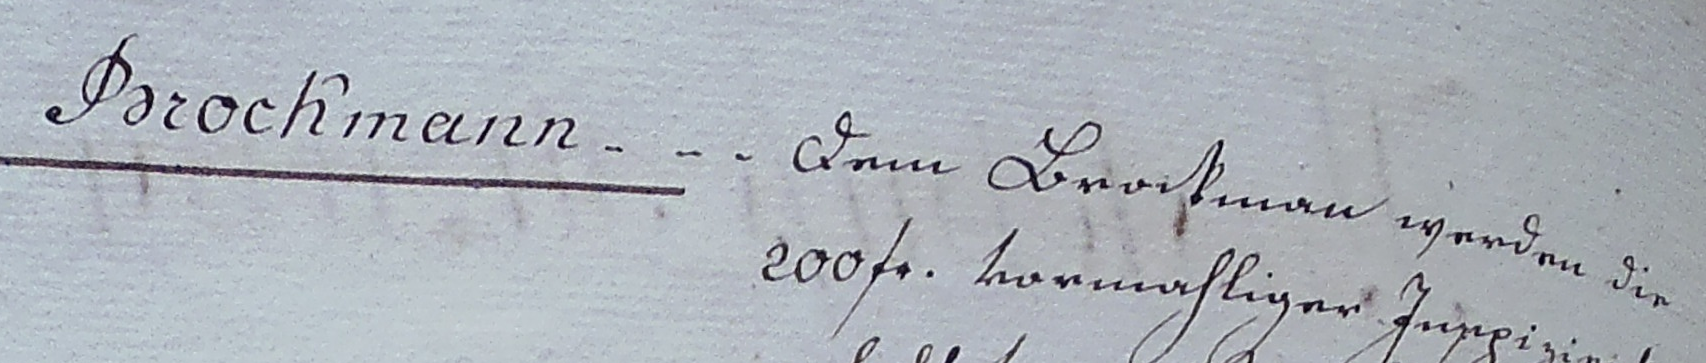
Brockmann .. .. .. Dem Brockman werden die
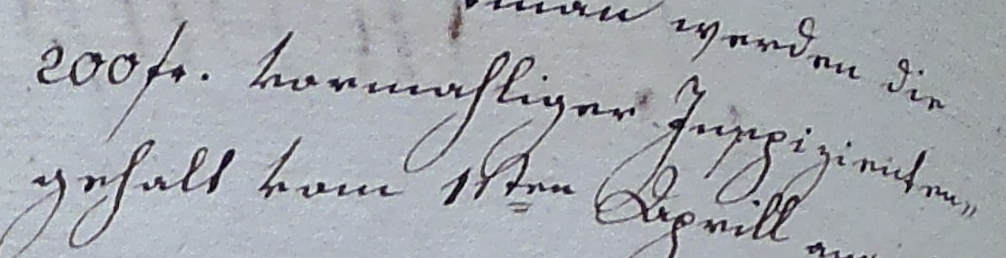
200fr. vormahliger Inspizienten¬
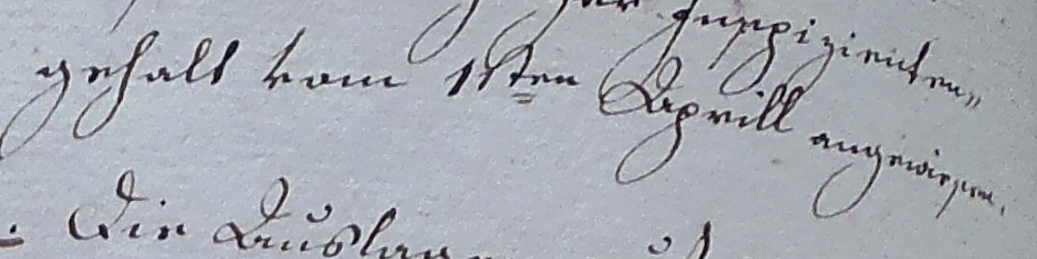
gehalt vom 1ste͇n Aprill engwiesen.
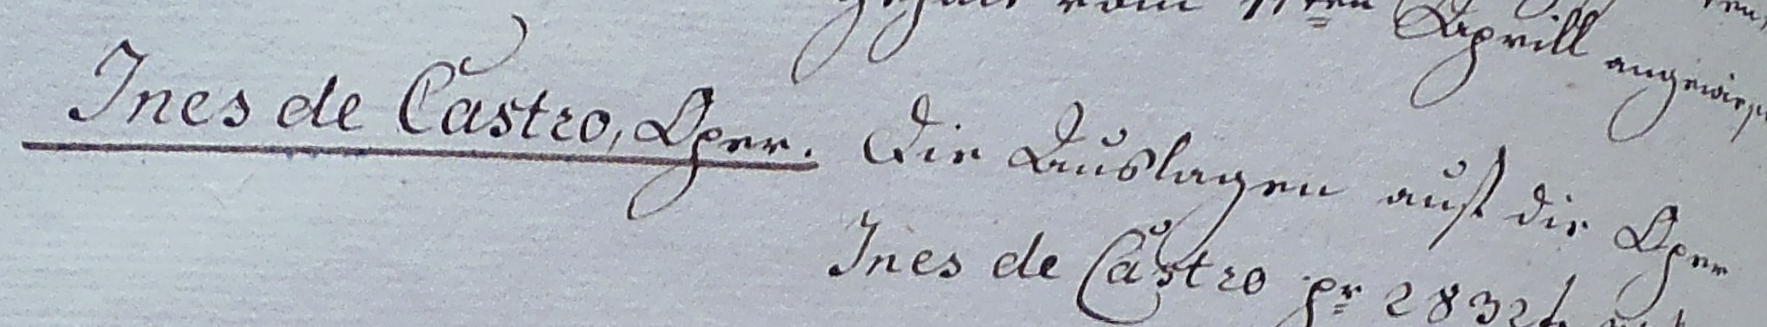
Ines de Castro, Oper. Die Auslagen auf die Oper
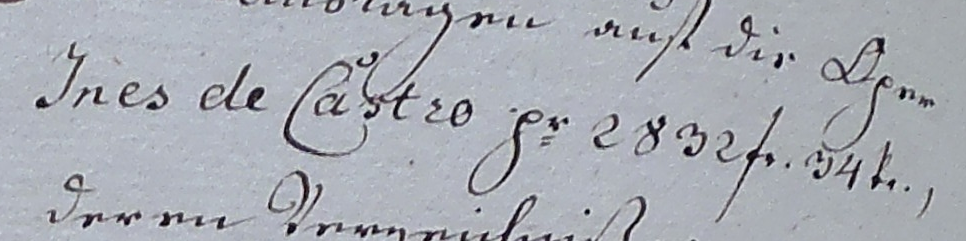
Ines de Castro pr͇ 2832fr. 34kr.,
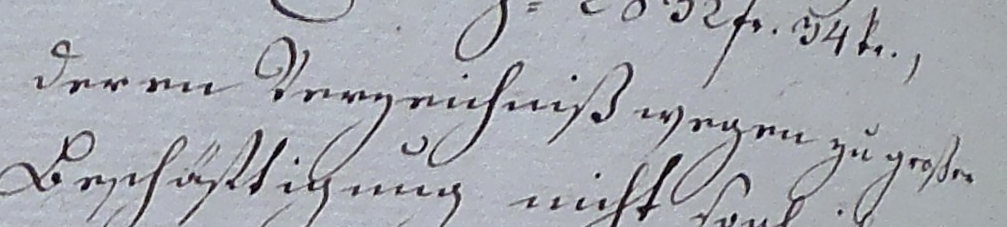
deren Verzeichniß wegen zu großer
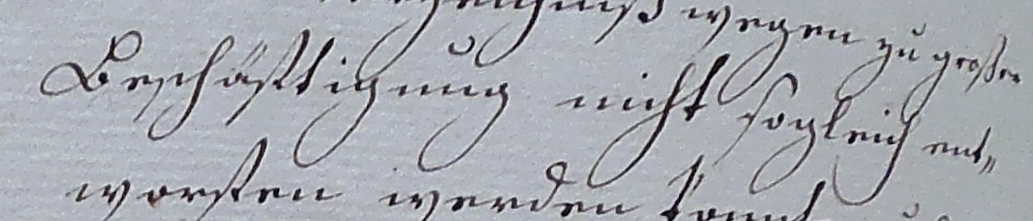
Beschäftigung nicht sogleich ent¬
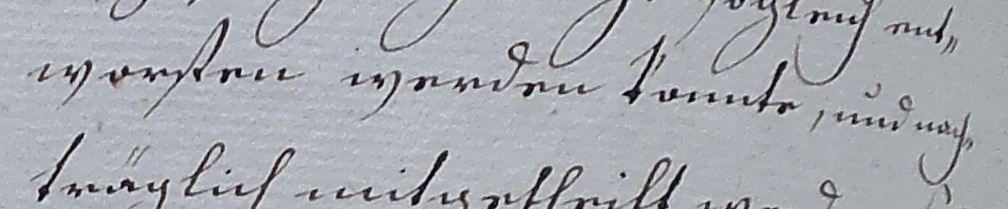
worfen werden konnte, und nach¬
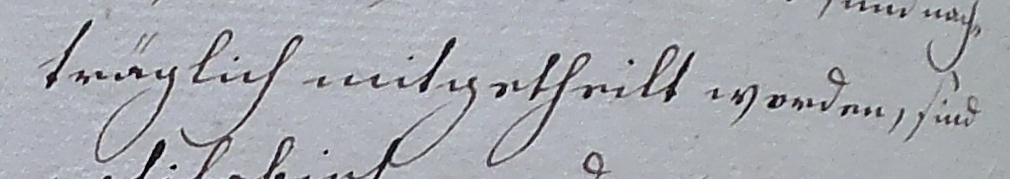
träglich mitgetheilt worden, sind
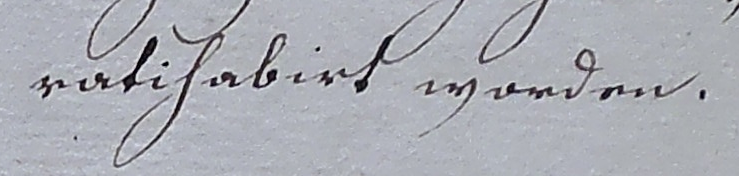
ratihabirt worden.
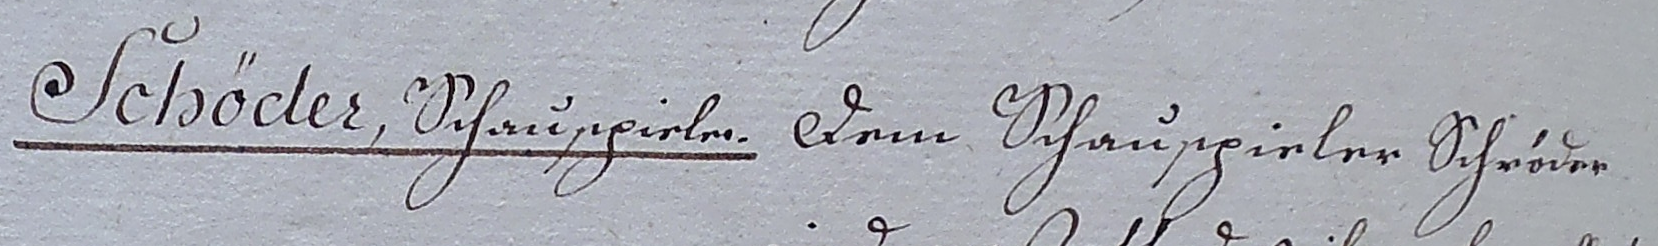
Schöder, Schauspieler. Dem Schauspieler Schöder
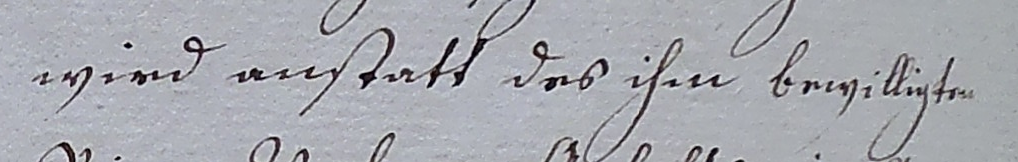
wird anstatt des ihm bewilligten
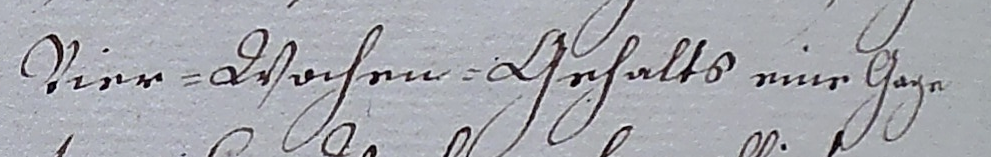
Vier=Wochen=Gehalts eine Gage
